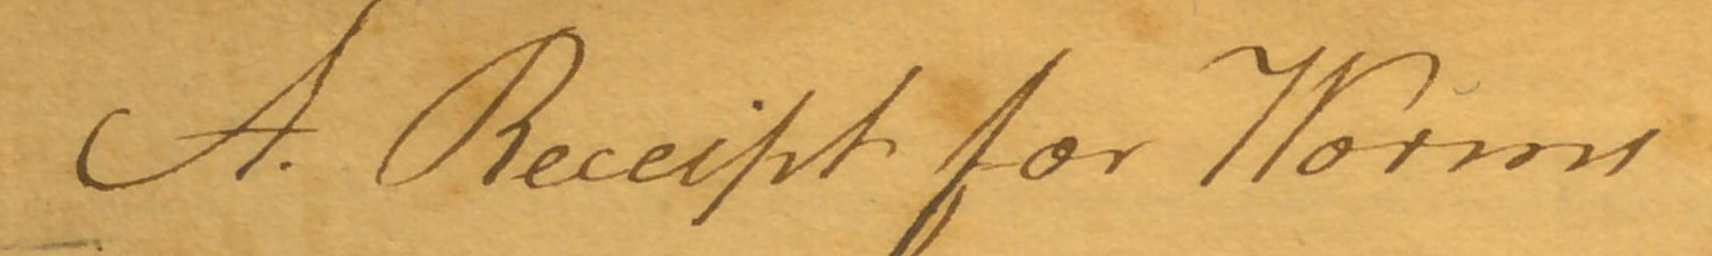A Receipt for Worms
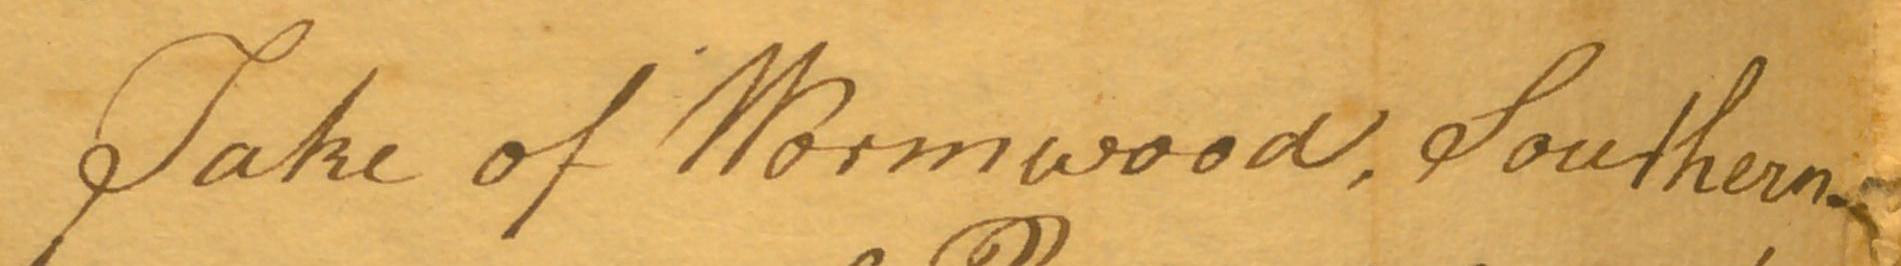Take of Wormwood Southern
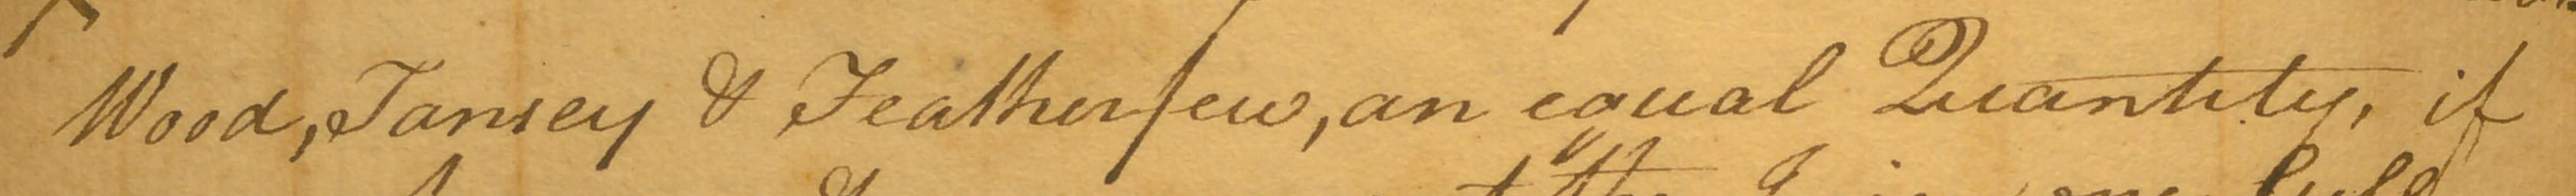Wood, Tansey & Featherfew, an equal Quantity, if
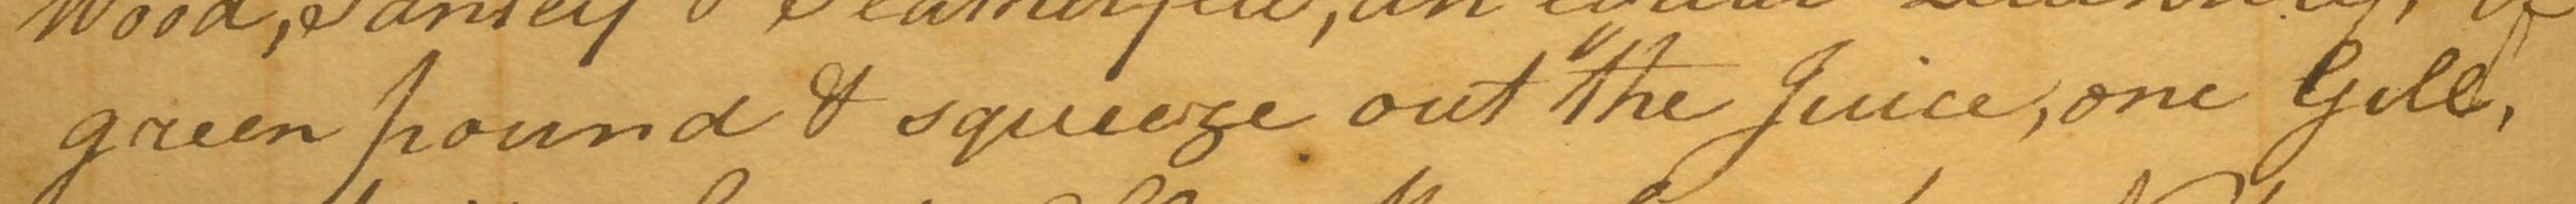green pound & squeeze out the Juice, one Gill,
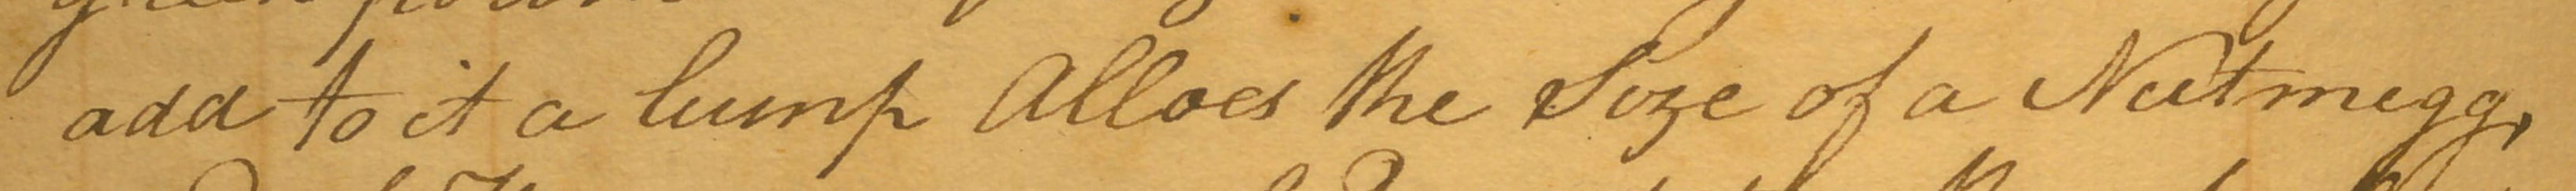add to it a lump Alloes the size of a Nutmegg,
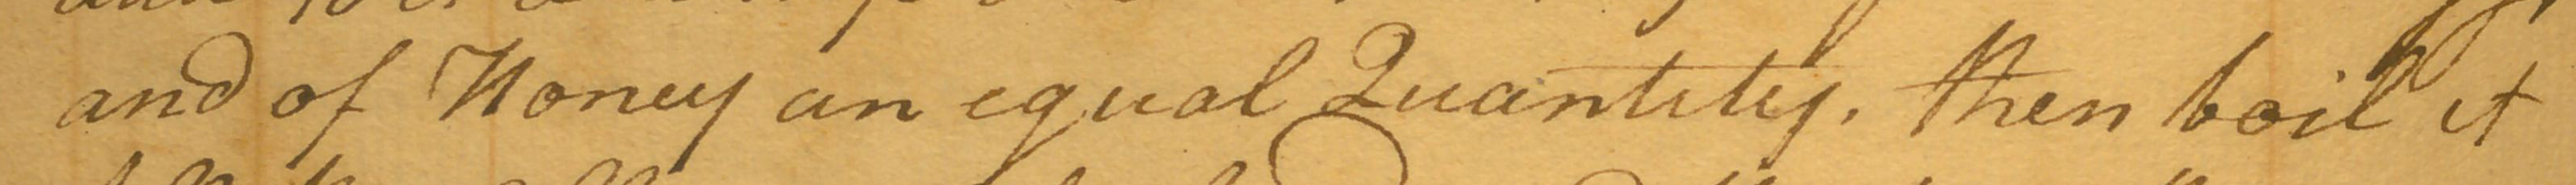and of honey an equal Quantity, then boil it
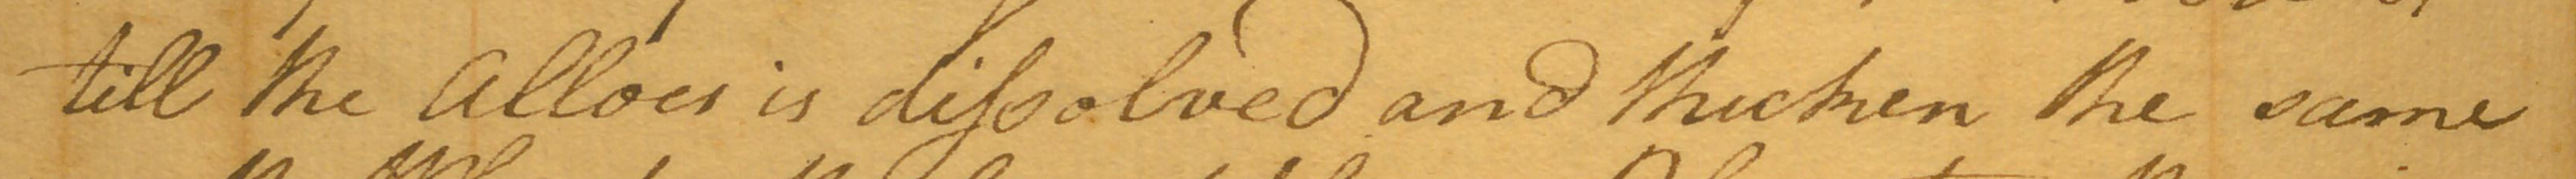till the Alloes is dissolved and thicken the same
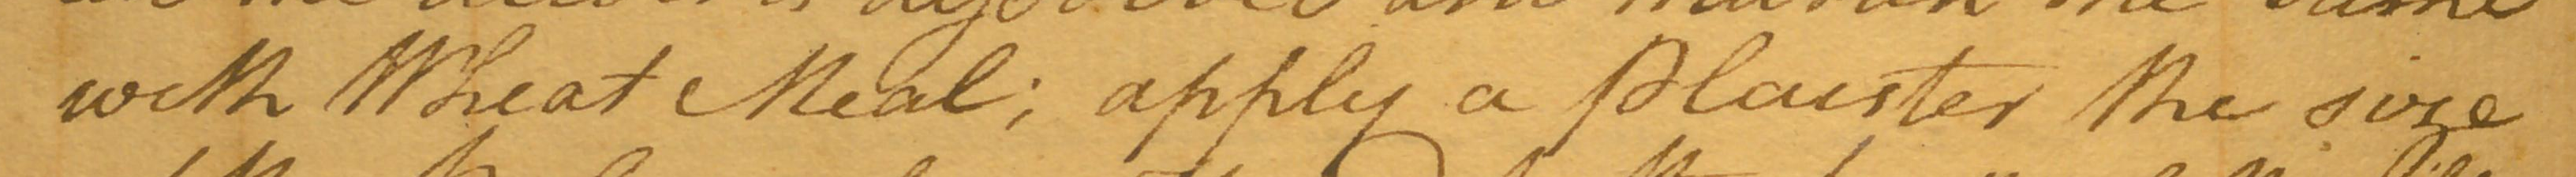with Wheat Meal; apply a Plaster the size
